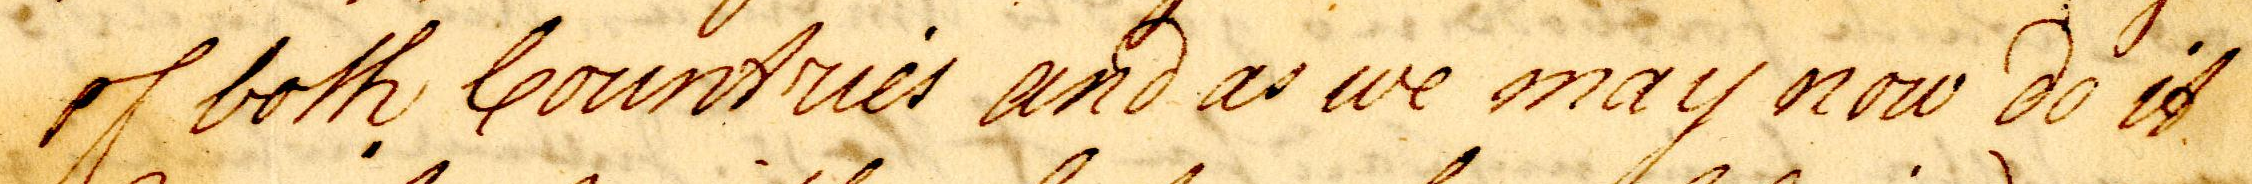of both Countries and as we may now do it
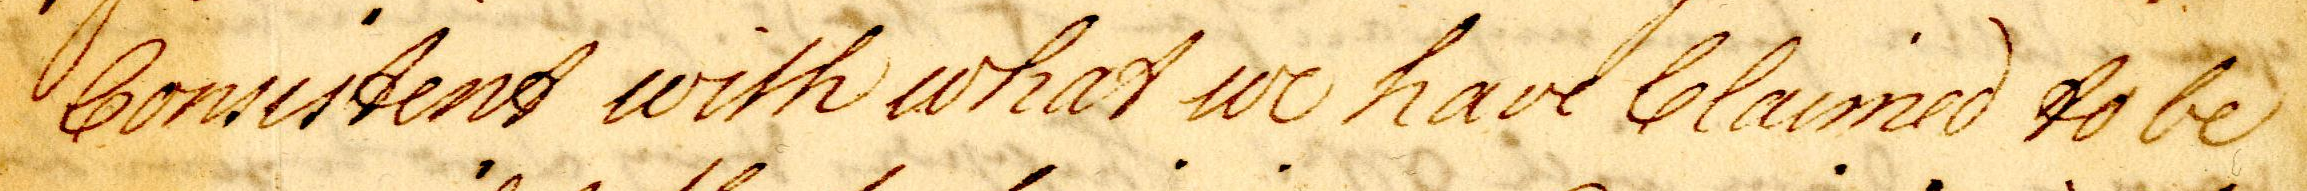Consistent with what we have Claimed to be
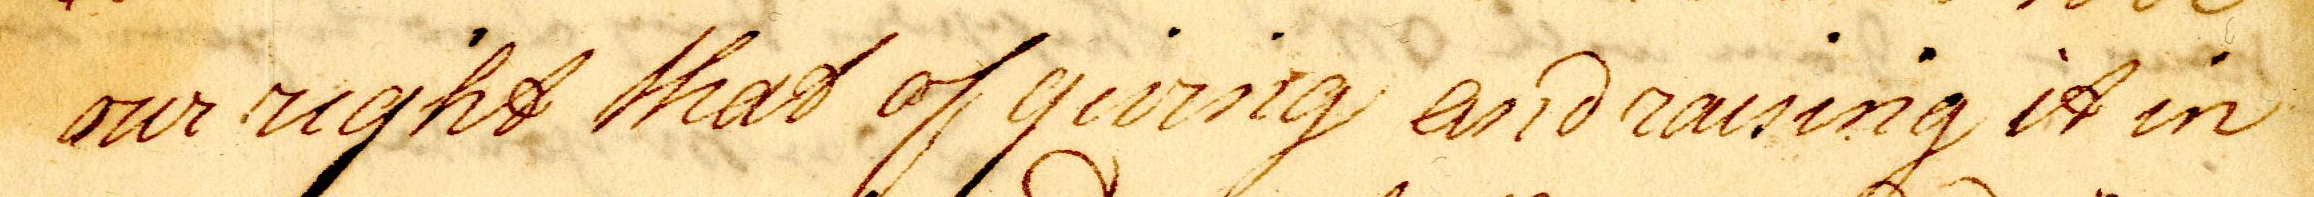our right that of giving and raising it in
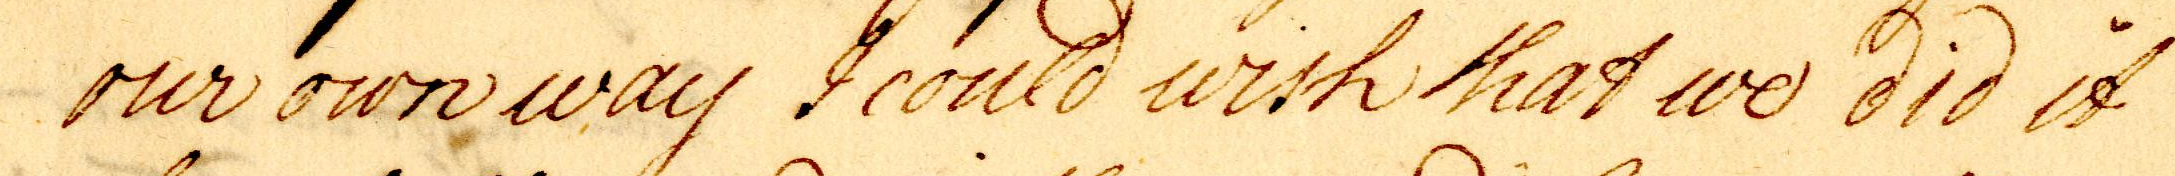our own way I could wish that we did it
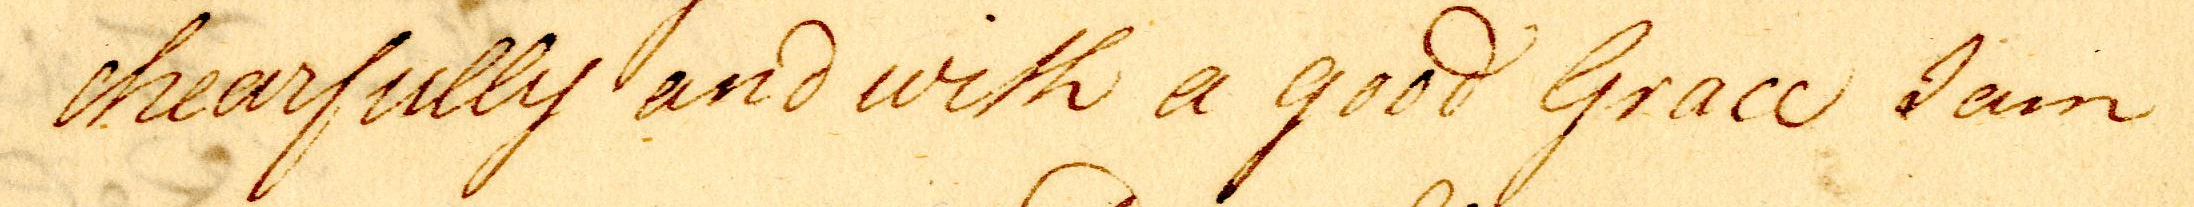chearfully and with a good Grace I am
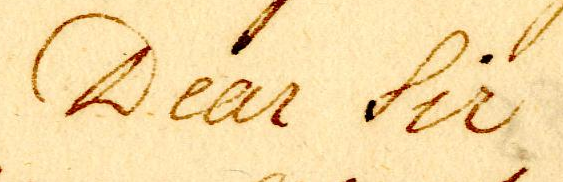Dear Sir
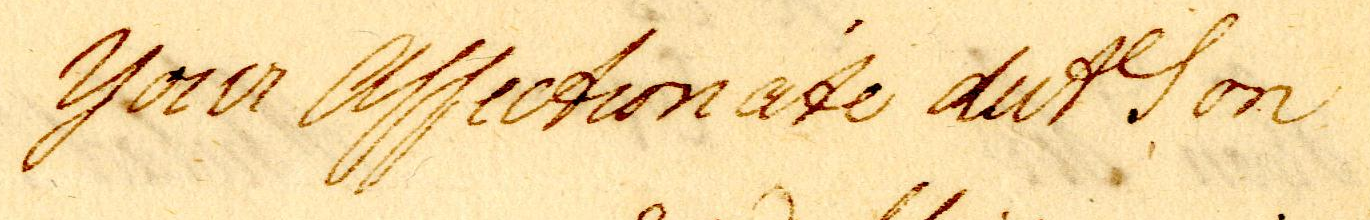Your Affectionate dut^l Son
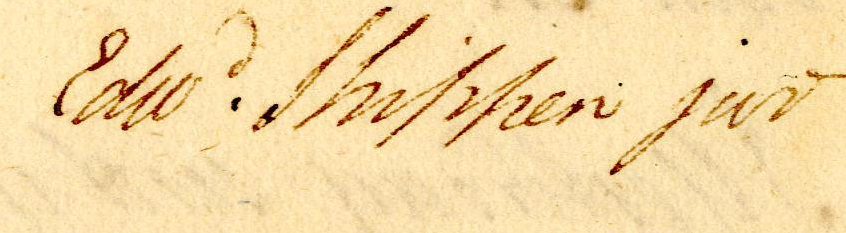Edw^d. Shippen jun^r.
